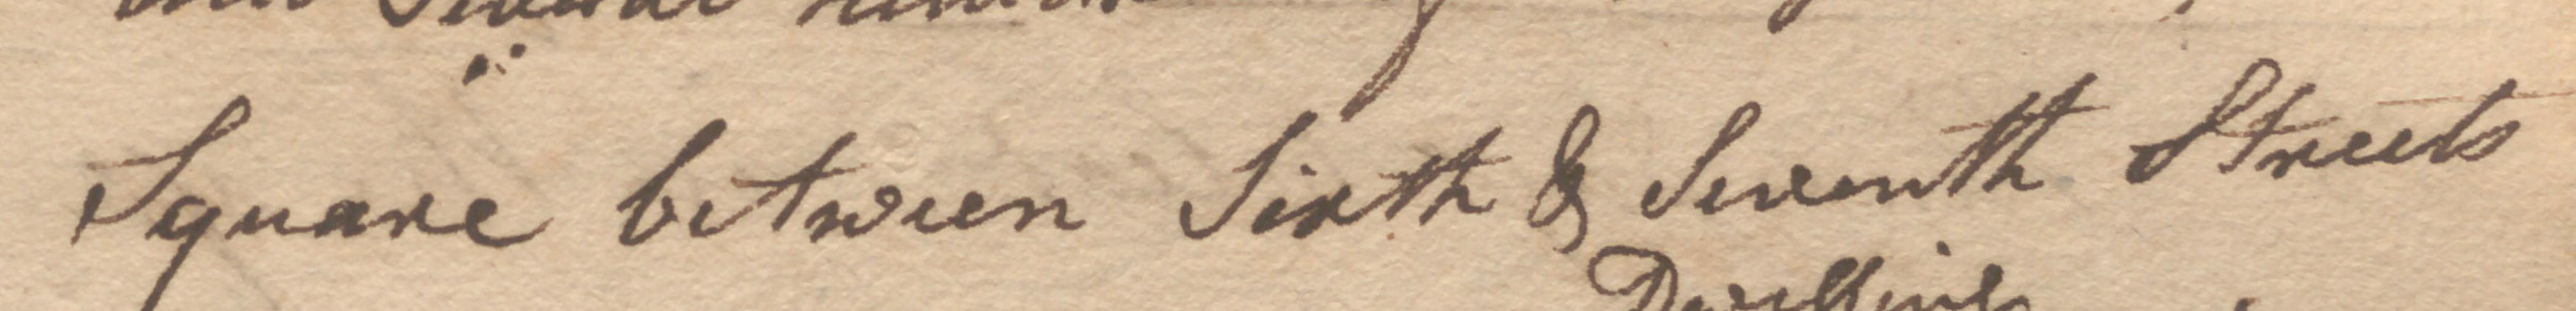Square between Sixth & Seventh Streets
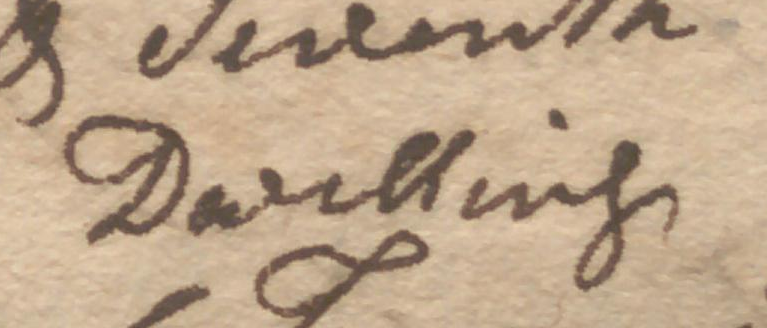Dwelling
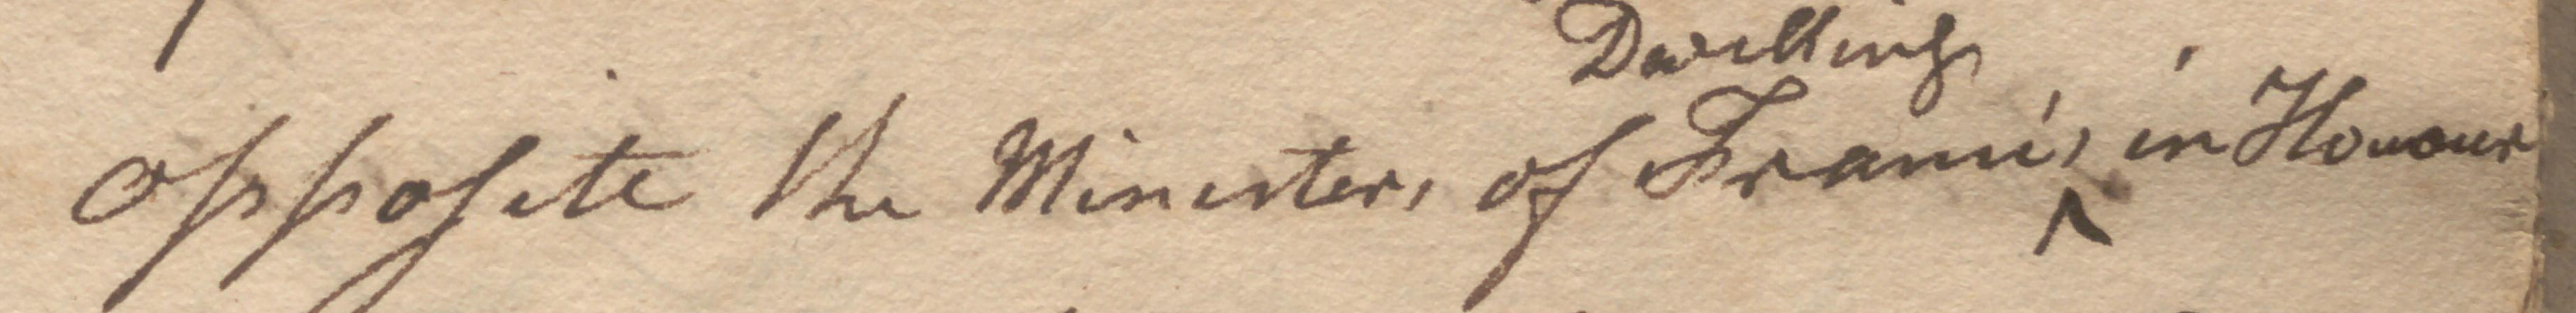opposite the Minesters of France's ^ in Honour
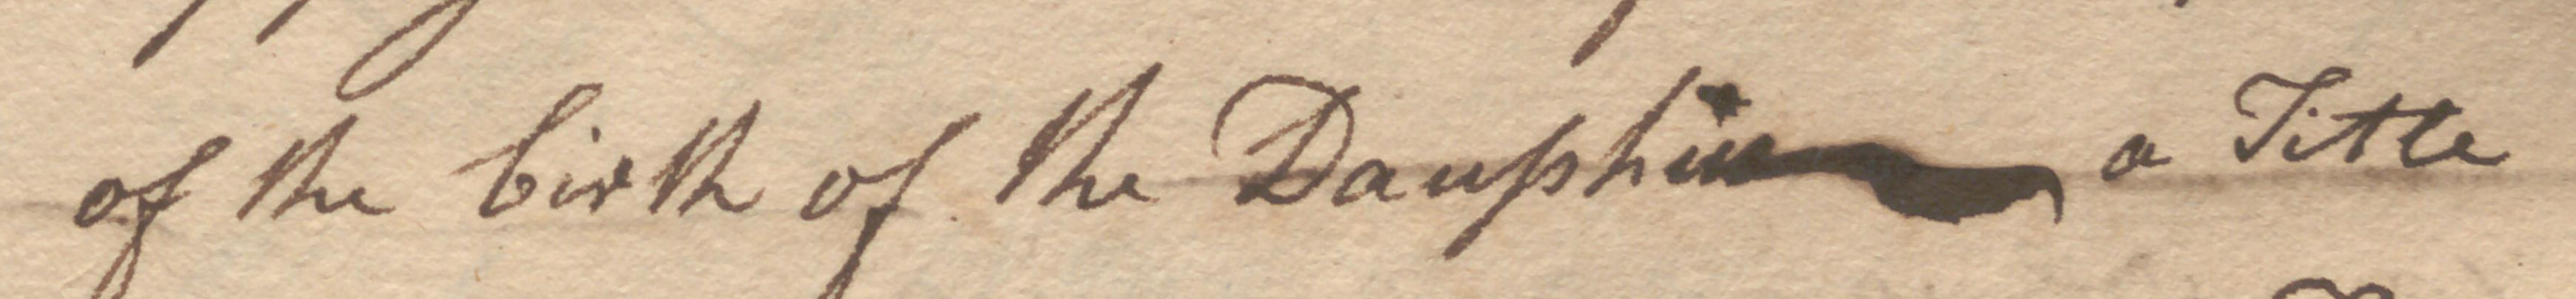of the birth of the Dauphin a Title
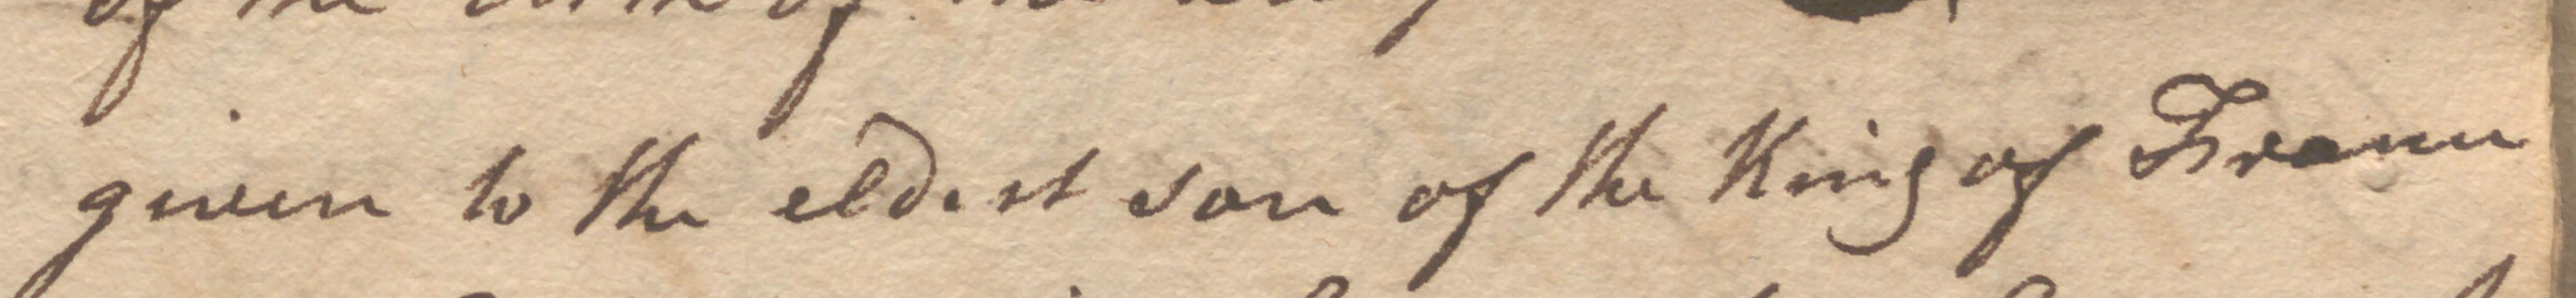given to the eldest son of the King of France
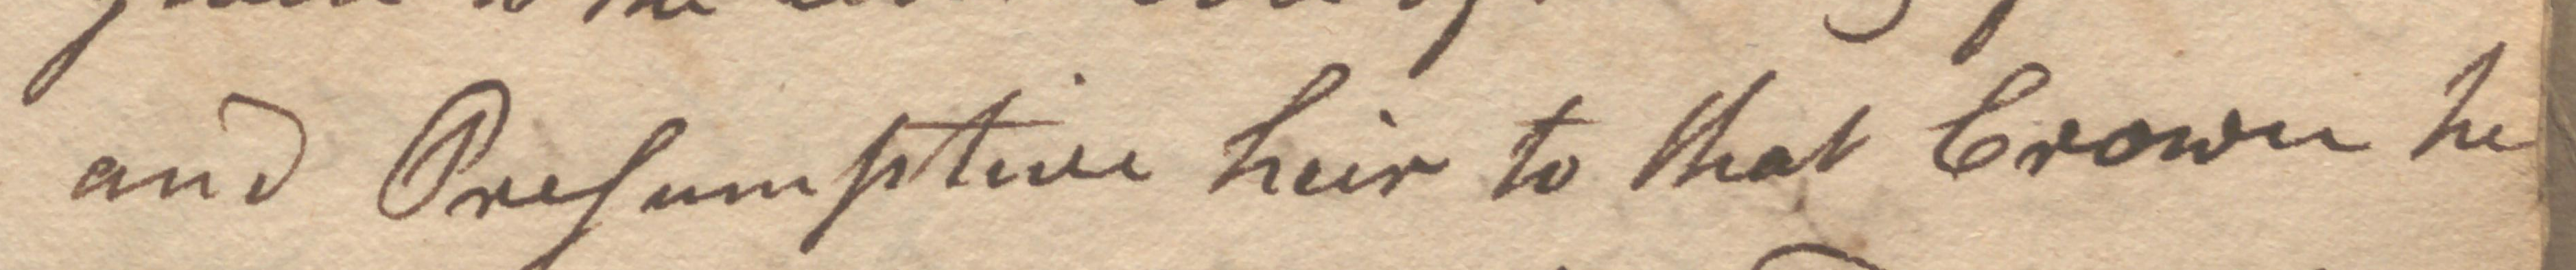and Presumptive heir to that Crown he
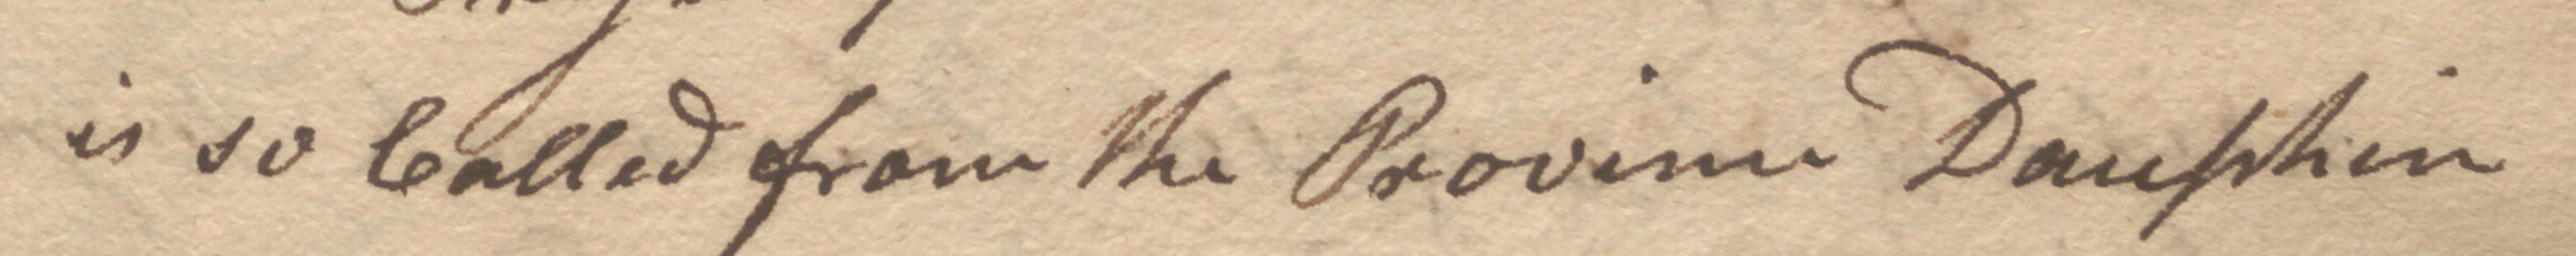is so Called from the Province Dauphin
